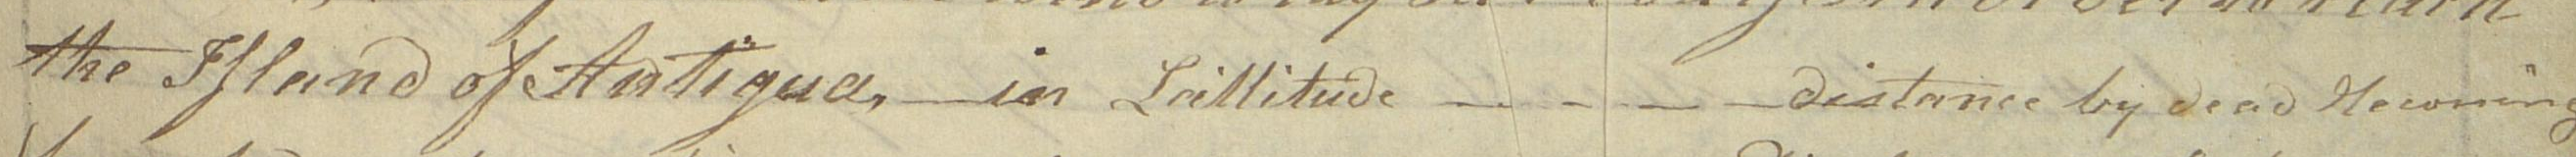the Island of Antigua, in Lattitude distance by dead Reconning
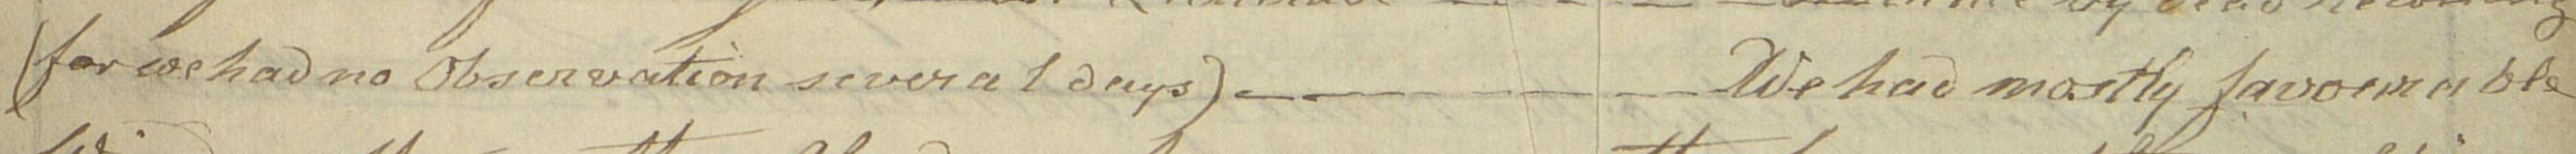(for we had observation several days) We had mostly favourable
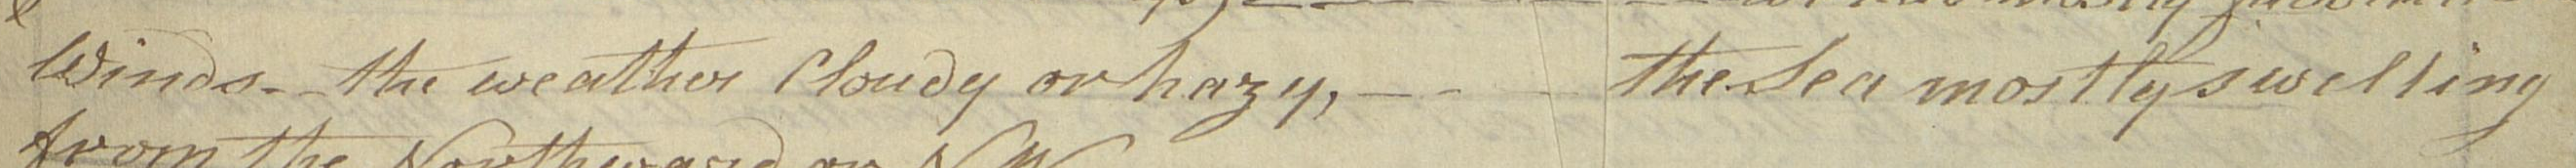Winds, the weather Cloudy or hazy, The sea mostly swelling
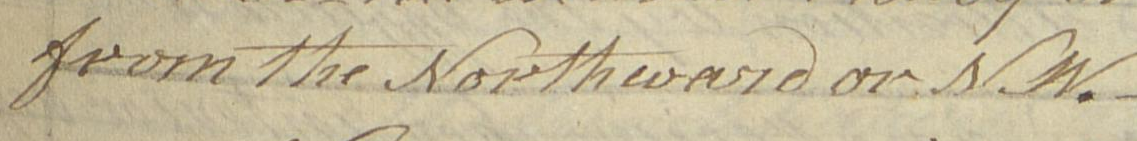from the Northward or NW.
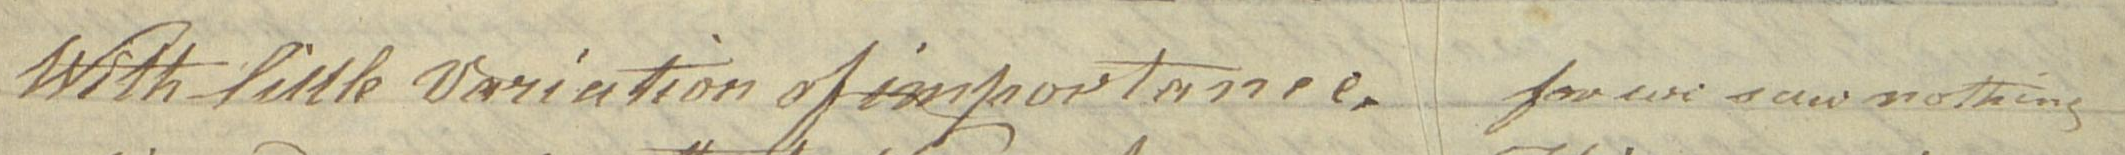With little Variation of importance, for we saw nothing
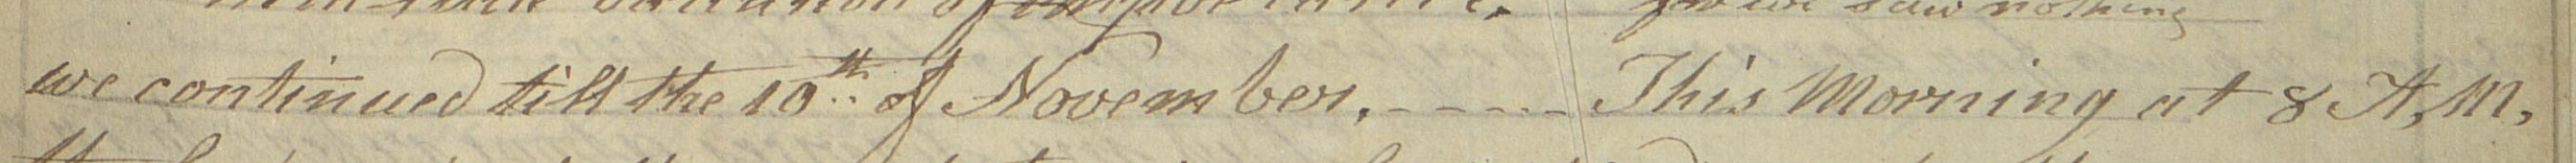we continued till the 10^th. of November, This Morning at 8 A. M.
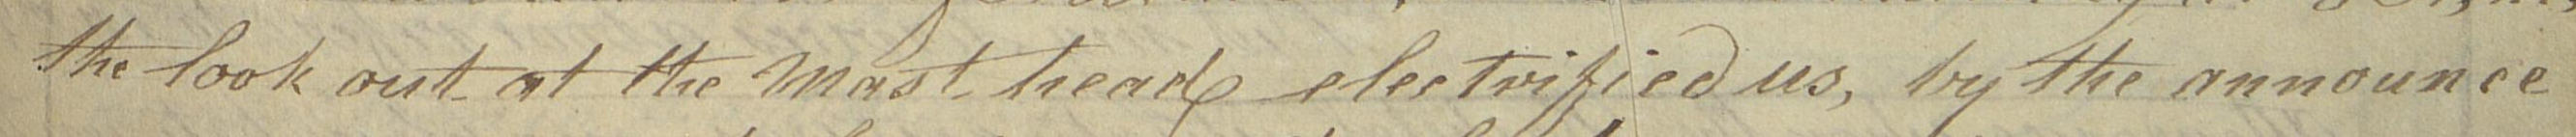the look out at the mast head electrified us, by the announce-
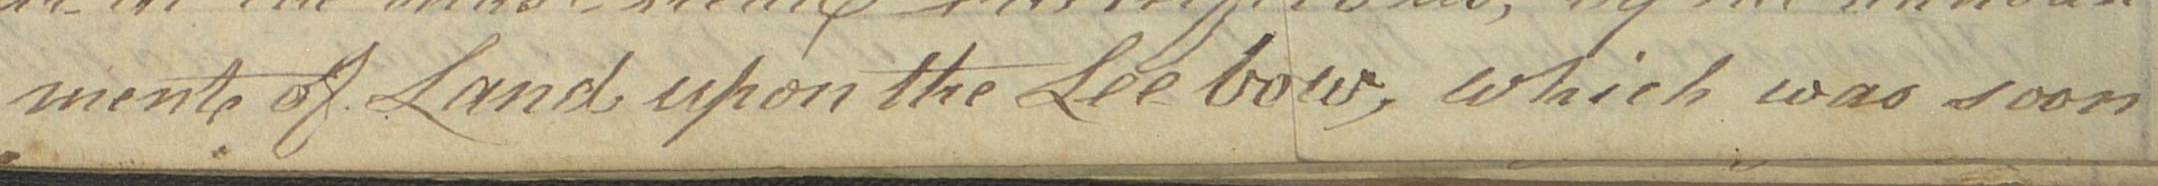-ments of Land upon the Lee bow, which was soon
